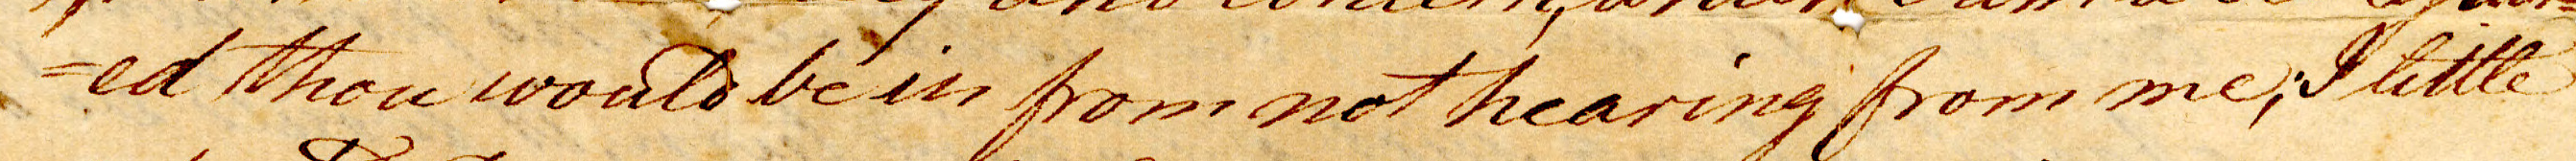-ed thou would be in from not hearing from me; I little
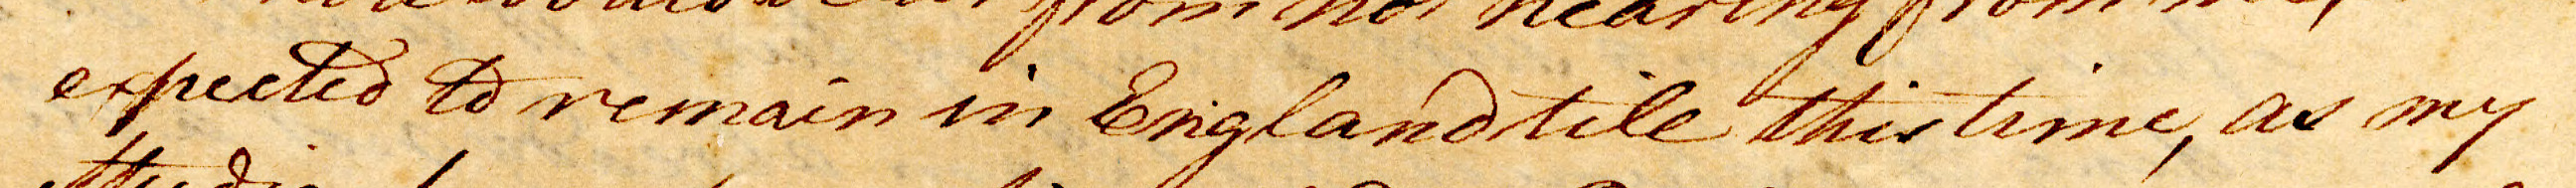expected to remain in England till this time, as my
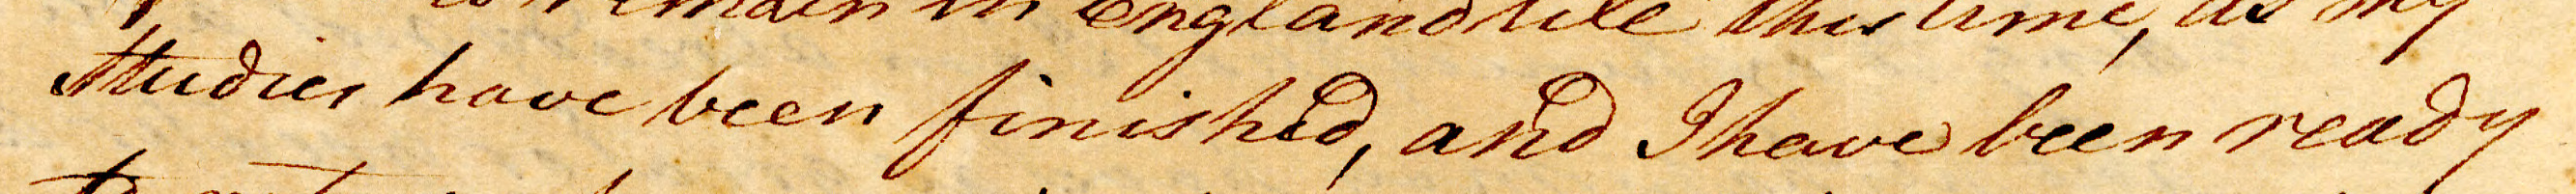Studies have been finished, and I have been ready
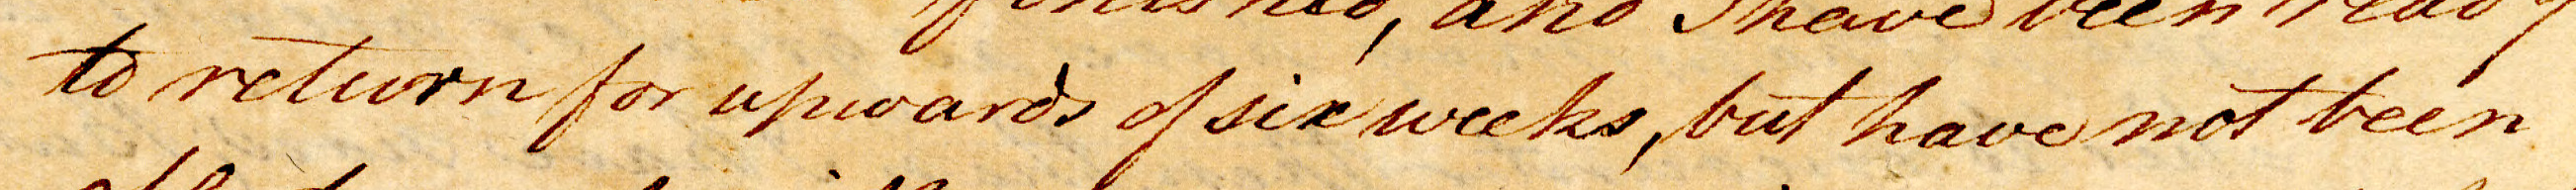to return for upwards of six weeks, but have not been
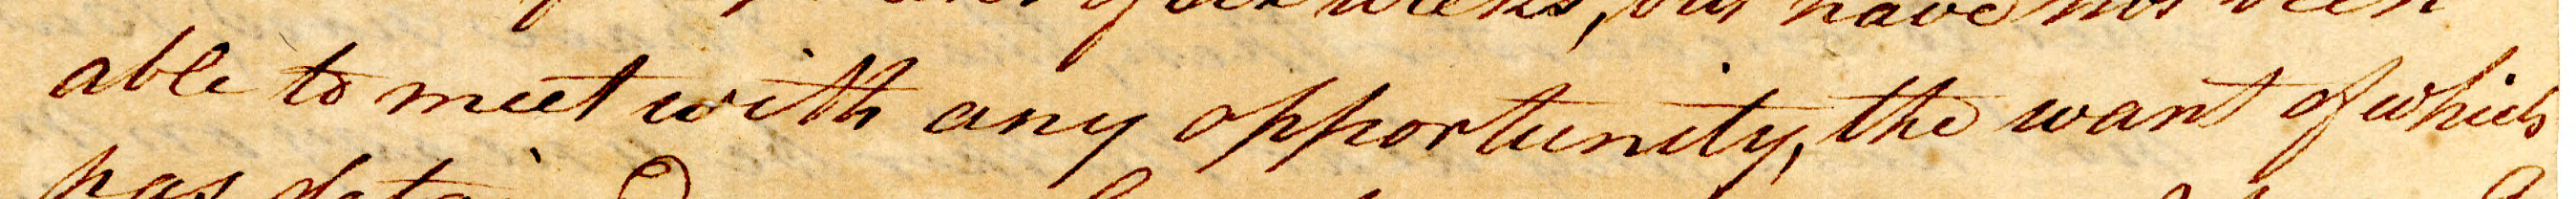able to meet with any opportunity, the want of which
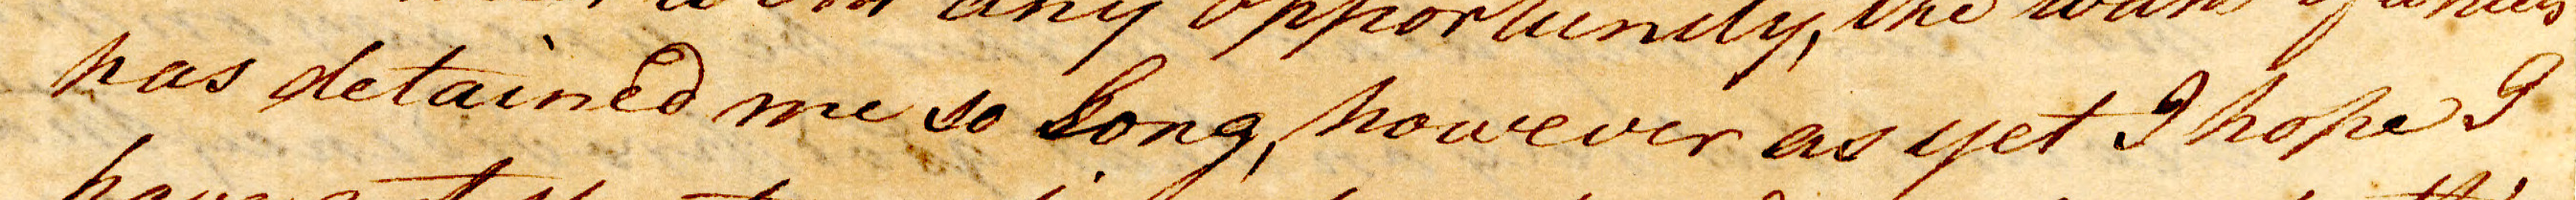has detained me so long, however as yet I hope I
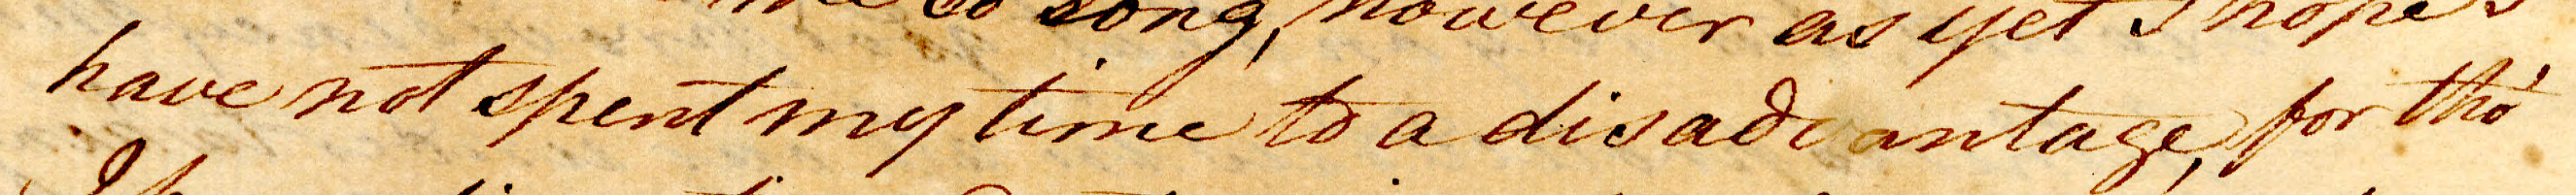have not spent my time to a disadvantage, for tho'
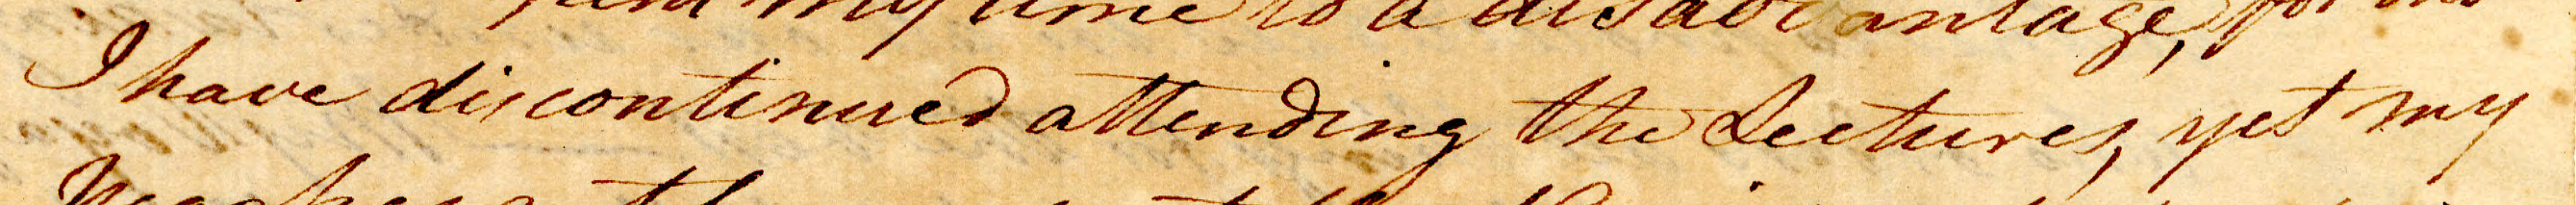I have discontinued attending the Lectures, yet my
